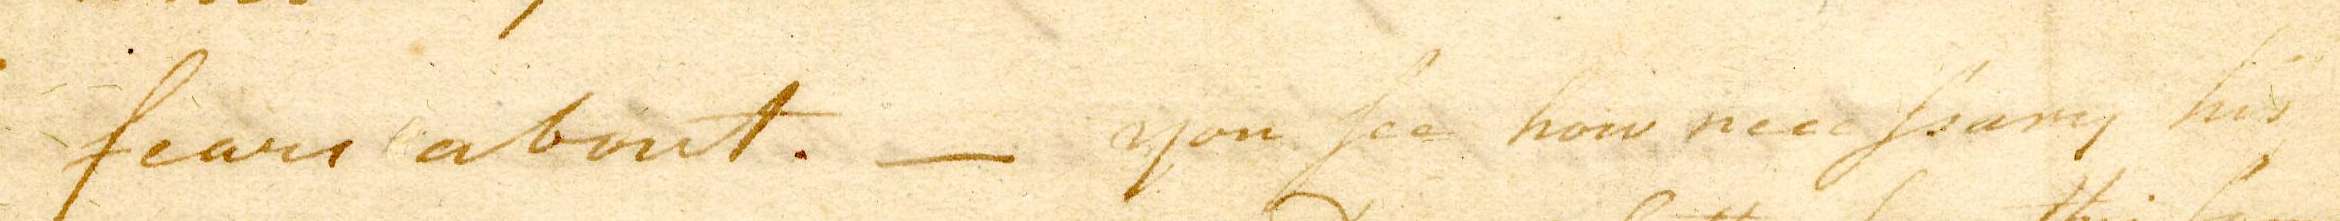fears about.- you see how necessary his
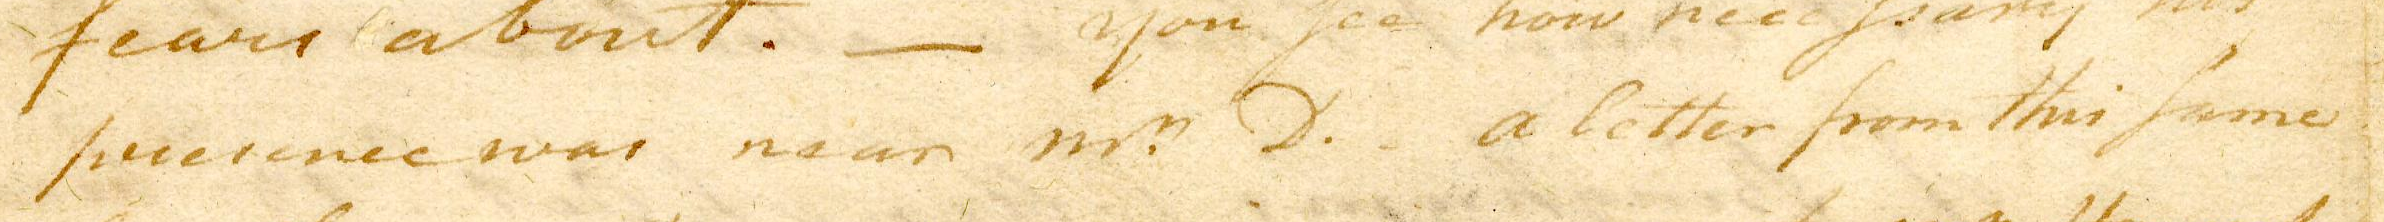presence was near M^r. D. A letter from this fine
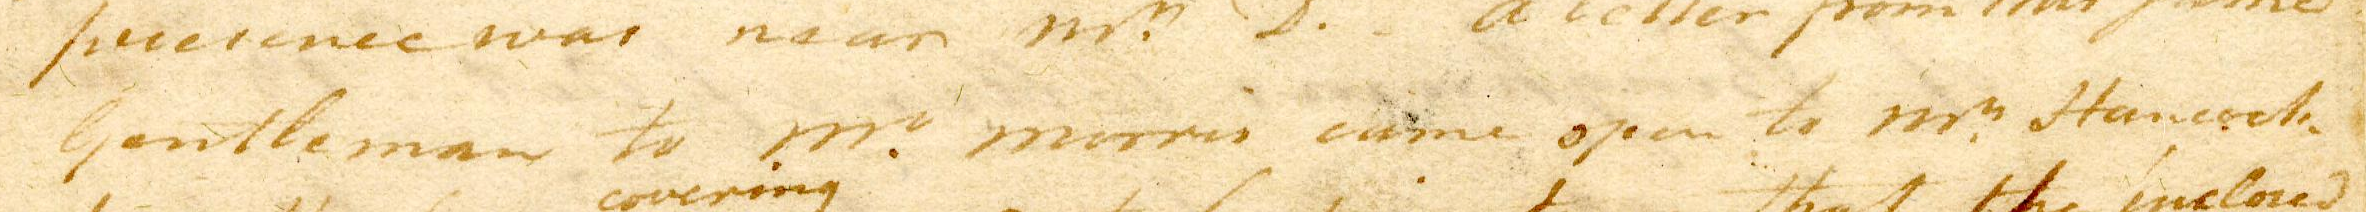Gentleman to M^r. Morris came open to M^r. Harwich
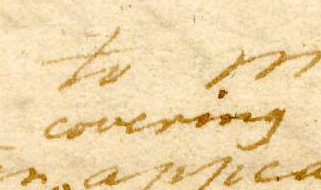covering
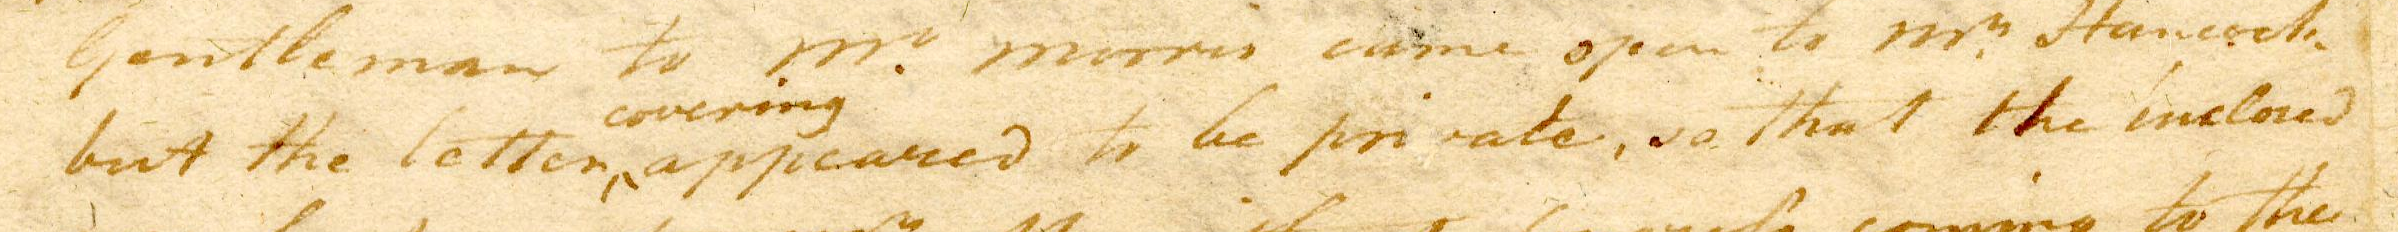but the letter ^ appeared to be private, so that the inclosed
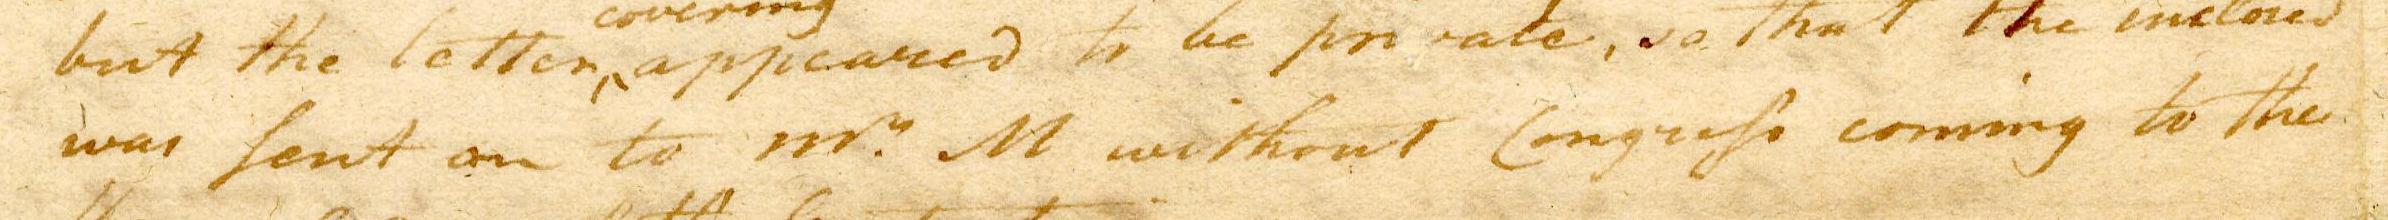was sent on to M^r. M without Congress coming to the
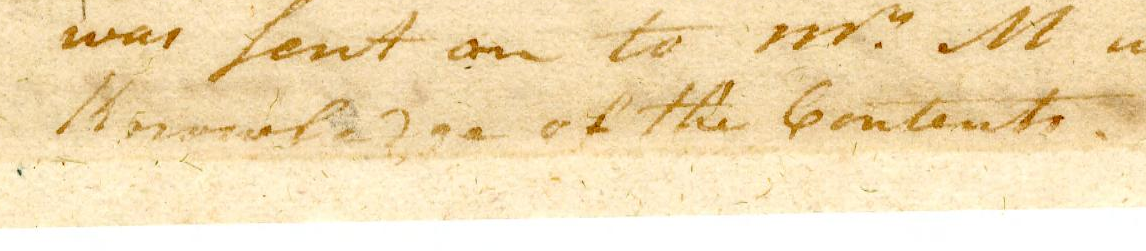Knowledge of the Contents
